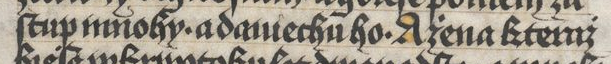ſtup mnohy.a dawechu ho. A żena kteraż
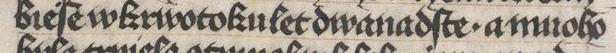bieẛe v krwotoku let dwanadſte.a mmoho
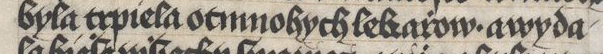byla trpiela otmnohych lekaṙow.a wyda¬
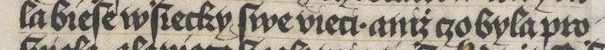la bíeẛe wẛiecký ſwe vieci.aniż czo byla pro¬
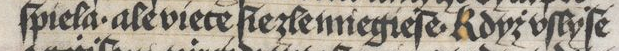ſpiela.ale víece ſie zle miegíeẛe.Když vſlyẛe¬
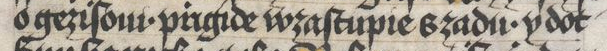o geżiẛowi.pṙigíde wozaſtupie szadu.y dot¬
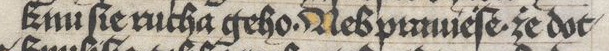knu ſie rucha geho.Neb prawíeẛe.że dot¬
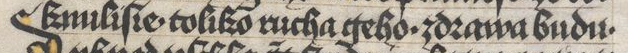knuli ſie.toliko rucha geho.zdrawa budu.
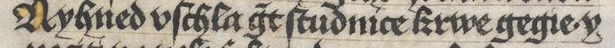A yhned uſchla ḡt ſtudnice krwe gegie.y
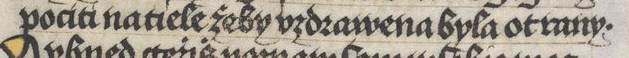pociti na tiele žeby vzdzawéna byla ot rany.
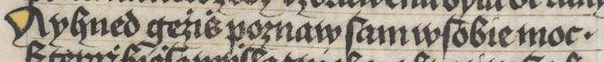A yhned geżiṡ poznaw ſam wſobie moc.
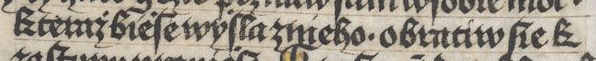kteraž bíeẛe wyẛla znieho.obratiw ſie k¬
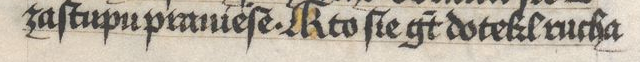zaſtupu prauíeẛe.Kto ſie ḡt dotekl rucha
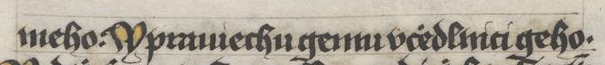meho? Y prauiechu gemu vċedlnici geho.
